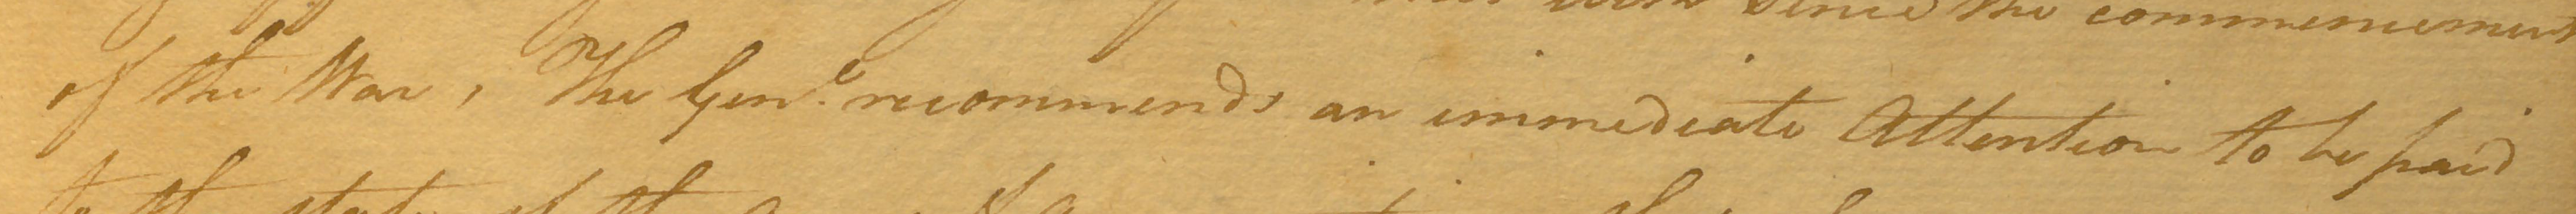of the War, The Gen^l. recommends an immediate Attention to be paid
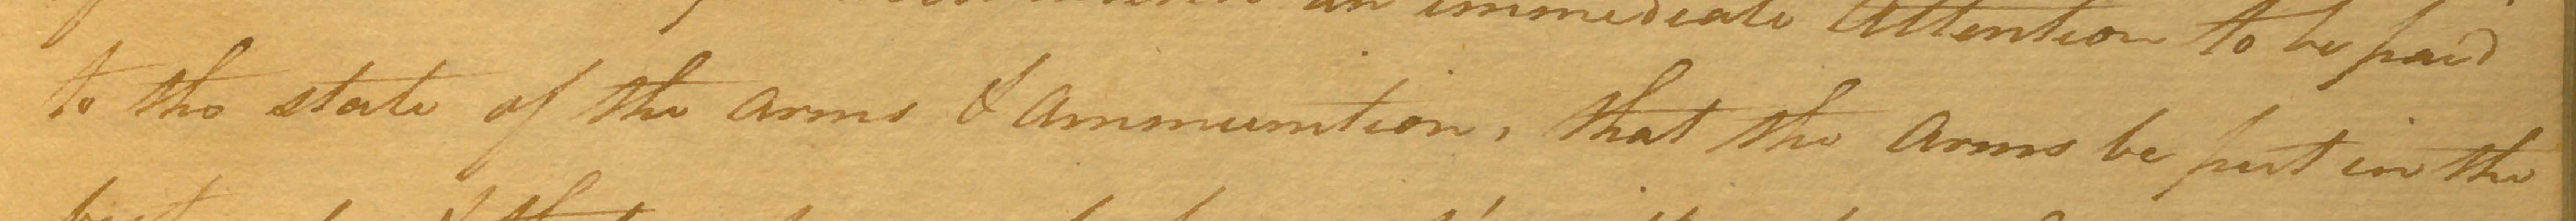to the state of the Arms & Ammunition, that the Arms be put in the
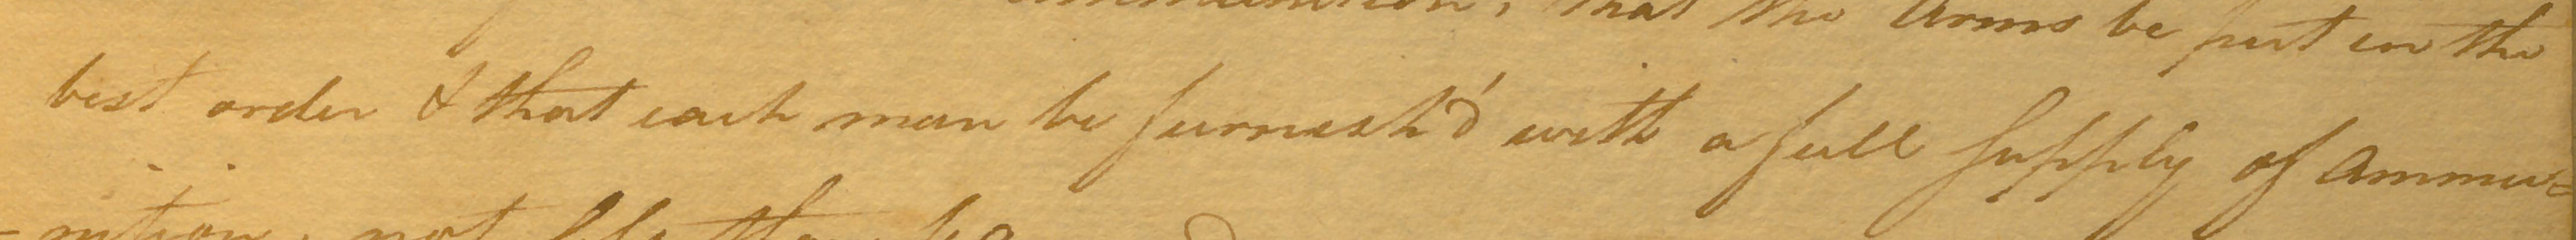best order & that each man be furnish'd with a full supply of Ammu
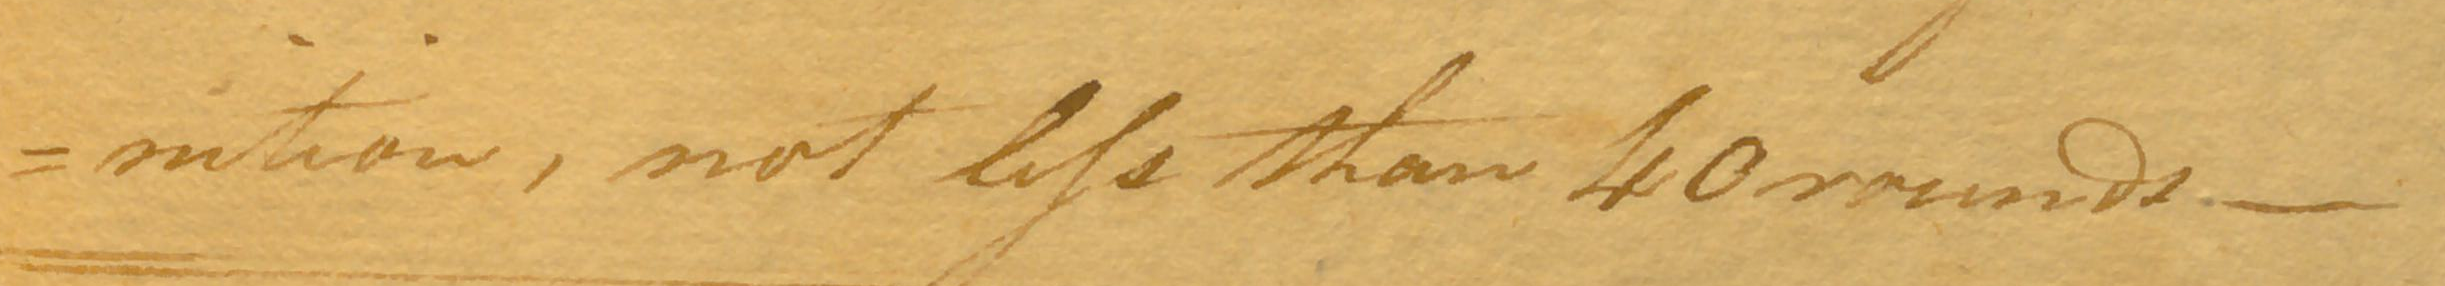-nition, not less than 40 rounds-
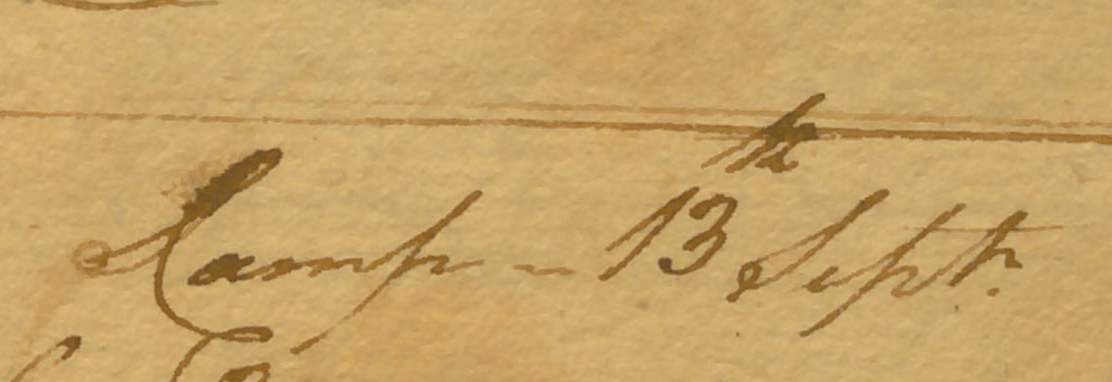Camp- 13^th Sept^r.
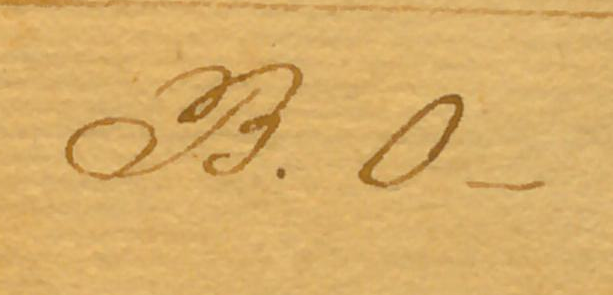B.O-
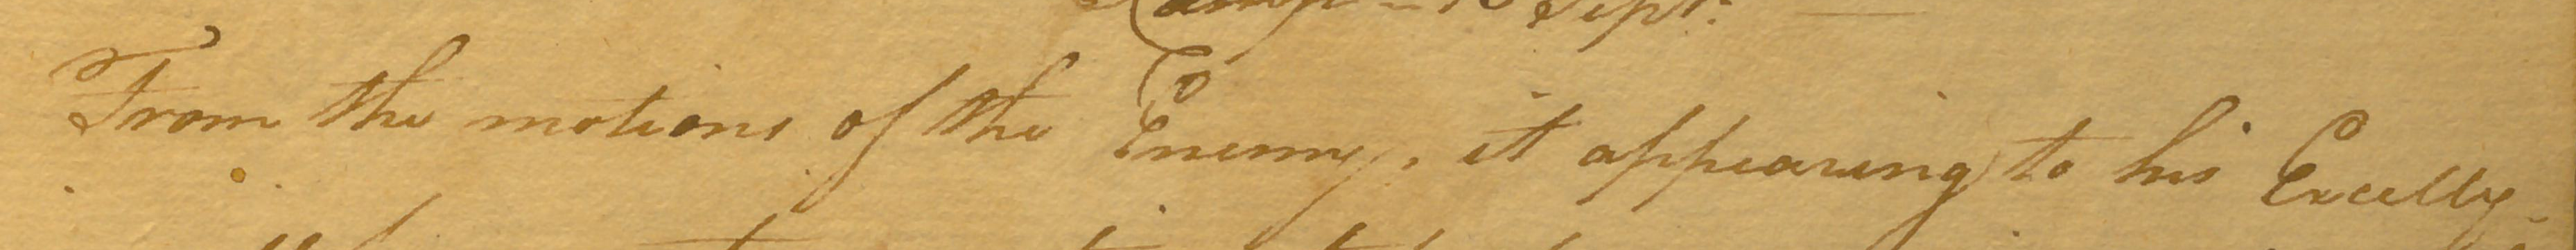From the motions of the Enemy, it appearing to his Excelly
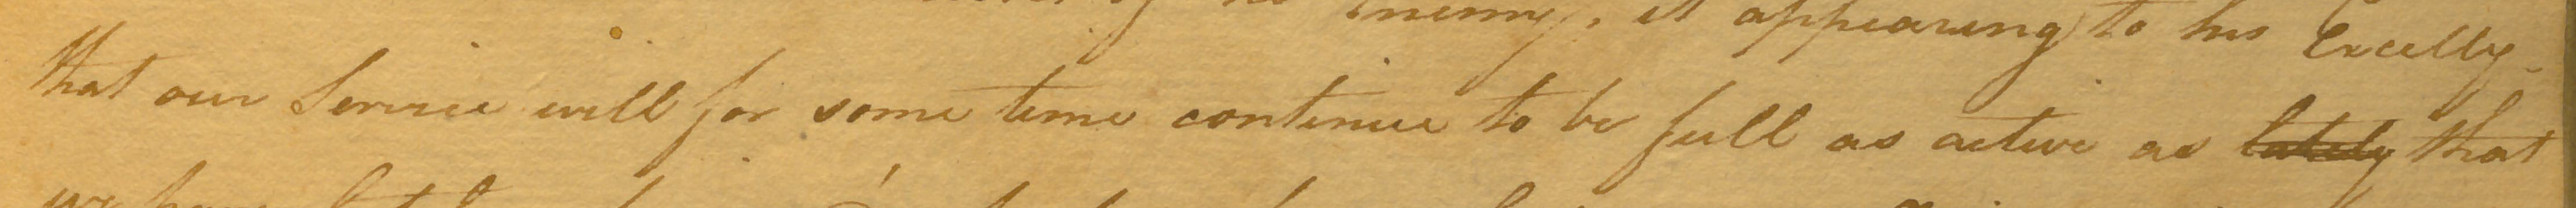that our Service will for some time continue to be full as active as [______] that
